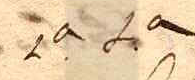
1ª t.a
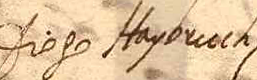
Diogo Haybruch
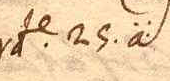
yde. 25. ā.
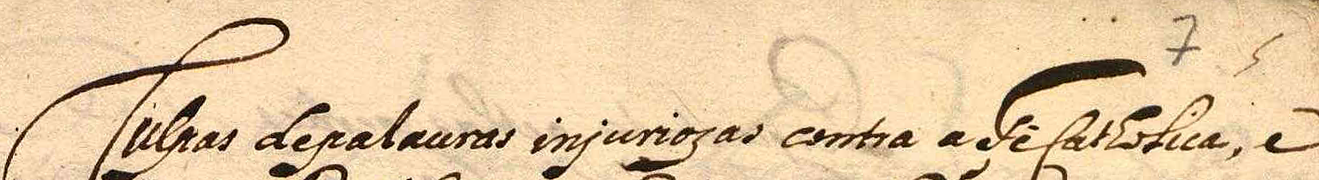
Culpas de palauras injuriozas contra a Fé Catholica, e
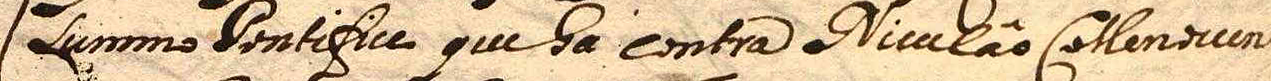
summo Pontifice que ha contra Niculâo Collenouen
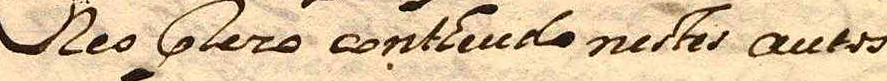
Reo prezo contheudo nestes autos
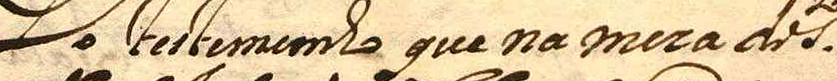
Do testemunho que na meza do s.to
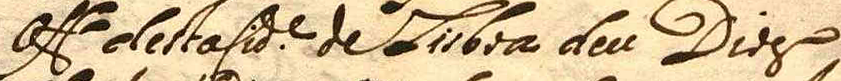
offo desta Cid.e de Lisboa deu Diogo
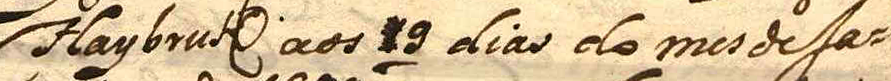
Haybruk aos _9 dias do mes de Ja
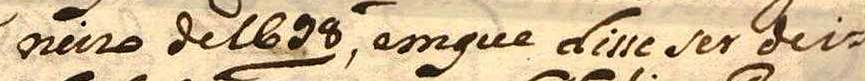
neiro de 1698, em que disse ser de i
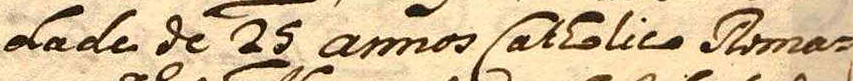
dade de 25 annos Catholico Roma
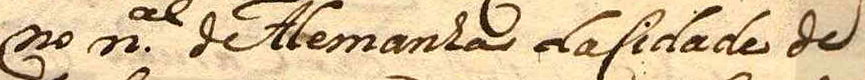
no n.al de Alemanha da Cidade de
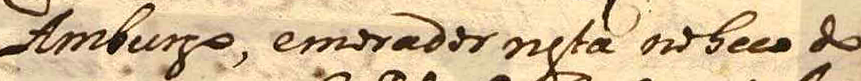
Amburgo, e morador nesta no beco do
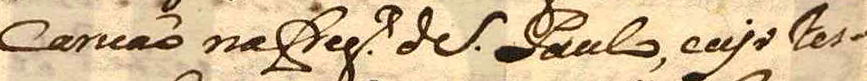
Caruão na freg.a de S. Paulo, cujo tes
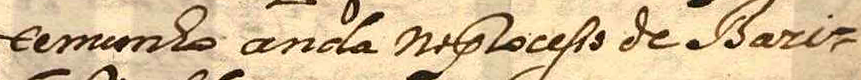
temunho anda no processo de Bazi
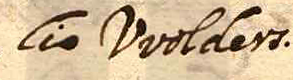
lio Vvolders.
